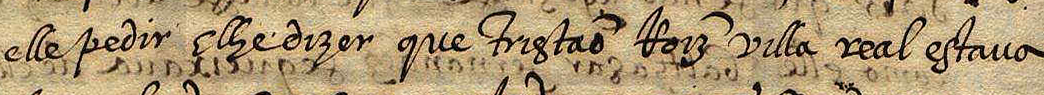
elle pedir E lhe dizer que tristaõ Roiz̄ villa real estaua
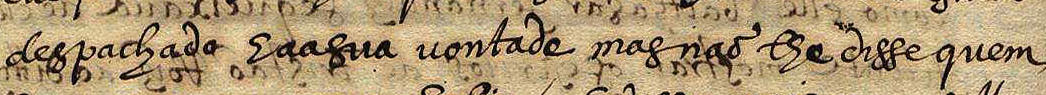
despachado E aa sua uontade mas naõ lhe disse quem
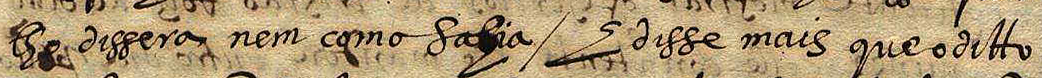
lho dissera nem como sabia / E disse mais que o ditto
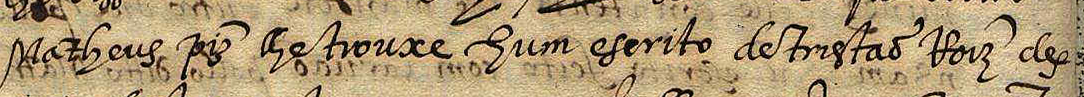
Matheus piz̄ lhe trouxe hum escrito de tristaõ Roiz̄ des
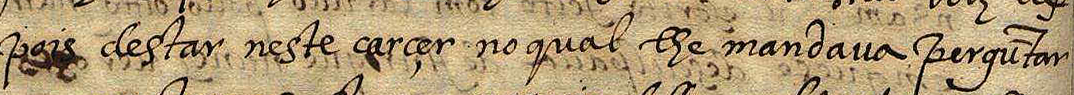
pois destar neste carçer no qual lhe mandaua pergūtar
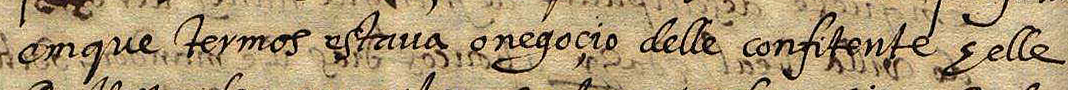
em que termos estaua o negoçio delle confitente E elle
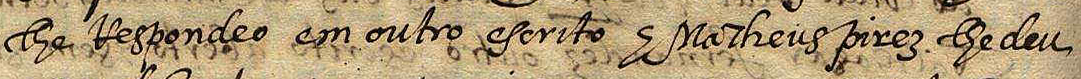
lhe Respondeo em outro escrito E Matheus pirez lhe deu
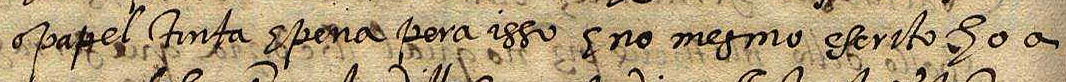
o papel tinta E pena pera isso E no mesmo escrito ho a
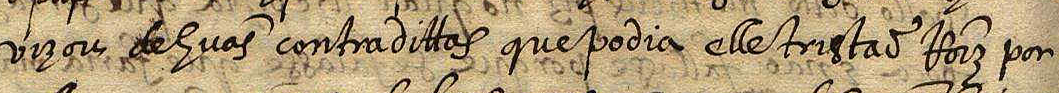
vizou de huas̄ contradittas que podia elle tristaõ Roīz por
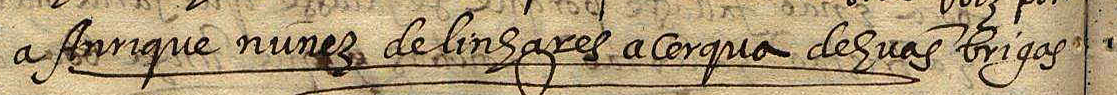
a Anrique nunez de linhares acerqua de huas̄ brigas /
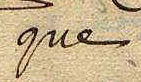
que
